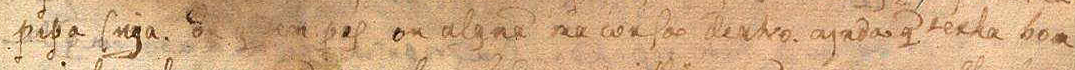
pipa Cuja _ _pos ou alguā ma cousa dentro ajnda q̄ tenha bom
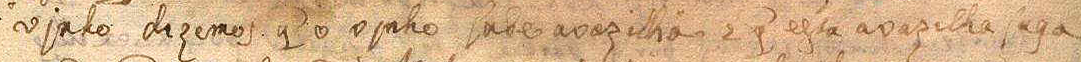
vjnho dizemos q̄ o vjnho sabe a vazilha, E q̄ esta a vazilha suja
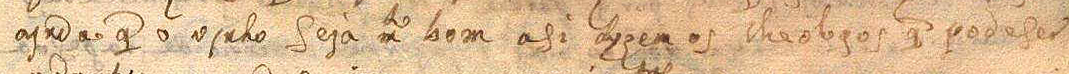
ajnda q̄ o vjnho seja mto bom asi dyzem os theologos q̄ pode ser
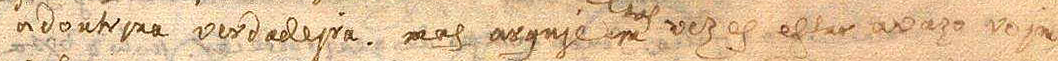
a doutrina verdadejra. mas arguje mtas vezes estar a vazo vejm
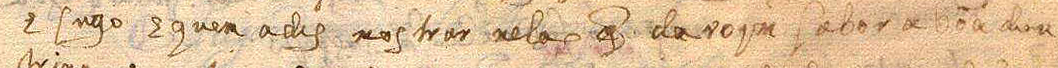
E Lugo e quem o dis mostrar nelas q̄ da rojm saber a boa dou
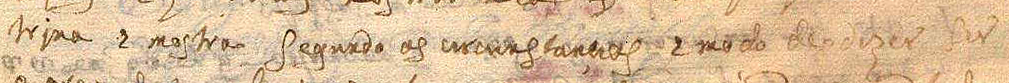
trjna E mostra segundo as circunstancias E modo de dizer ser
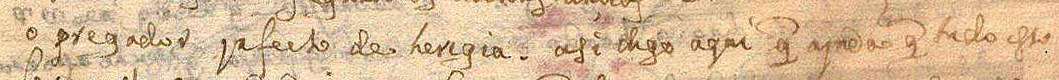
o pregador jnfecto de heregia. asi digo aqui q̄ ajnda q̄ tudo isto
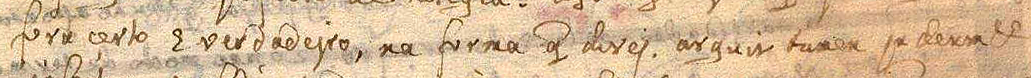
fora certo E verdadejro, na forma q̄ direj arguir tamen judeum &
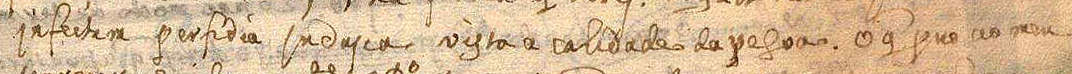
jnfectam perfidia judajca vista a calidade da pesoas. O q̄ ꝓuo ao meu
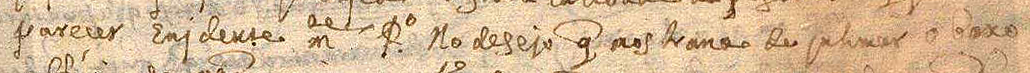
parecer Eujdentemte P.o no deseio q̄ mostrando de ??? o baxo
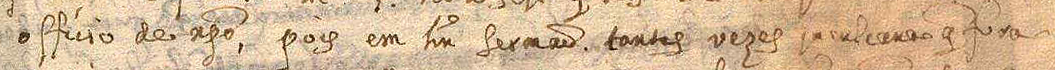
officio de xpō, pois em hū sermaõ tantas vezes se aleuado??? q̄ fora
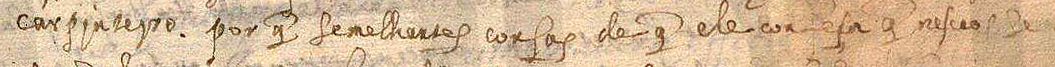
carpjntejro porq̄ semelhantes cousas de q̄ ele confesa q̄ nescios se
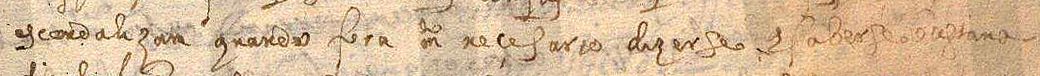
escandalizam quando fora mto necesario dizerse E saberse bastaua
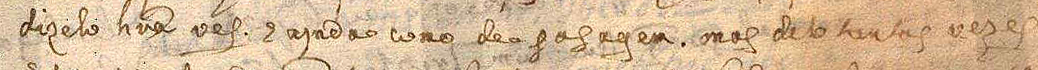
dizelo huā ves. E ajnda como de pasagem. mas dito tantas vezes
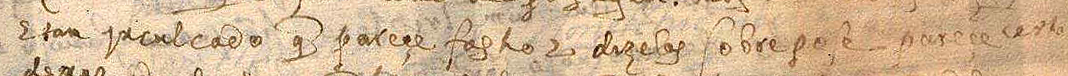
E tam jnculcado q̄ parece fastio E dizelas sobre pose parece certo
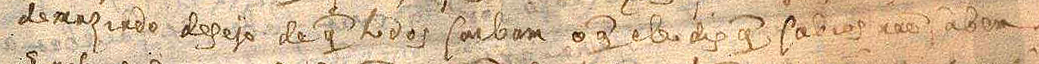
demaziado desejo de q̄ todos saibam o q̄ ele dis q̄ sabios não sabem
